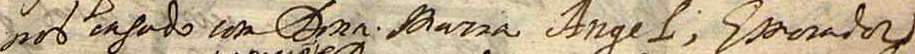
nos casado com Dona Maria AngeL, E morador
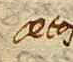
ætas
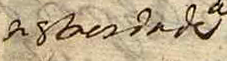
nesta cidade
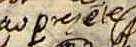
ao prezēte
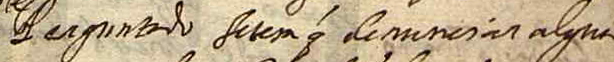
Perguntado se tem q̄ denunciar alguā
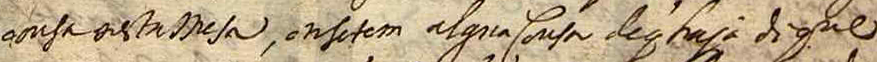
cousa nesta mesa, ou se tem alguā Cousa de q̄ haja de que
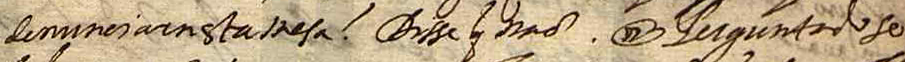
denunciar nesta mesa? Disse q̄ naõ. ¶ Perguntado se
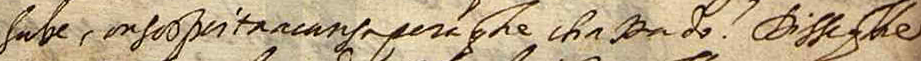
sabe, ou sospeita a causa pera q̄ he chamado? Disse q̄ lhe
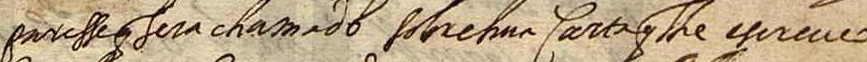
paresse q̄ sera chamado sobre hua Carta q̄ lhe escreueo
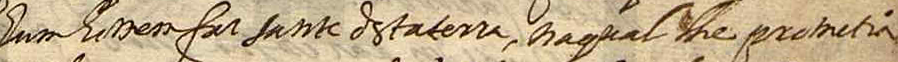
hum homem farsante desta terra, na qual lhe prometia
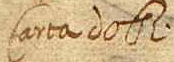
Carta do R.
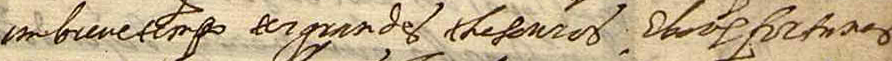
em breue tempo ter grandes thesouros E boas fortunas
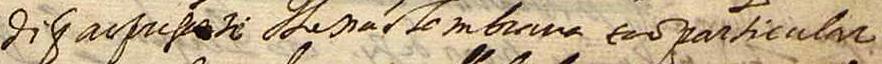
de q̄ ao presente lhe naõ lembraua tão particular
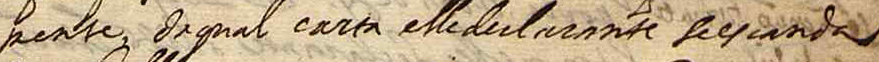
mente, da qual carta elle declarante se escanda
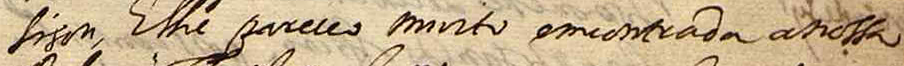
lisou, E lhe pareceo muito emcontrada a nossa
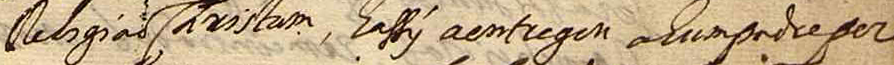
Religiaõ Christam, E assy a entregou a hum padre per
